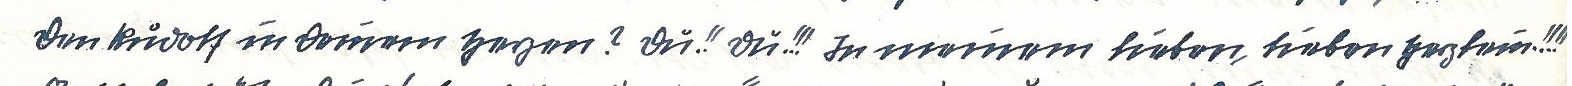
Dein Rudolf in Deinem Herzen? Du!! Du!!! In meinem lieben, lieben Herzlein!!!!
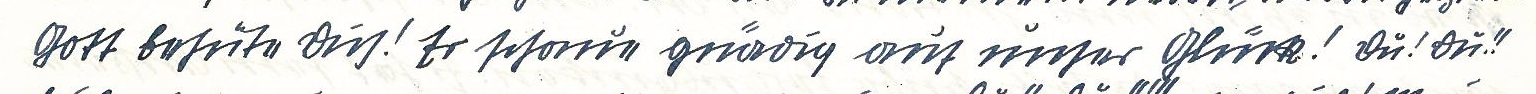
Gott behüte Dich! Er schaue gnädig auf unser Glück! Du! Du!!
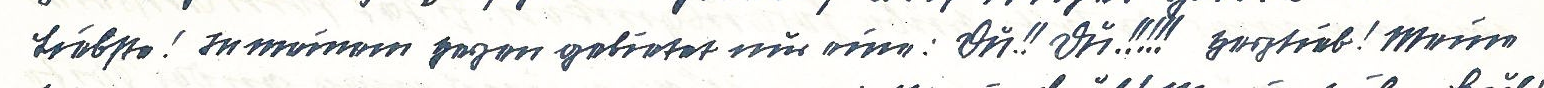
Liebste! In meinem Herzen gebietet nur eine: Du!! Du!!!!! Herzlieb! Meine
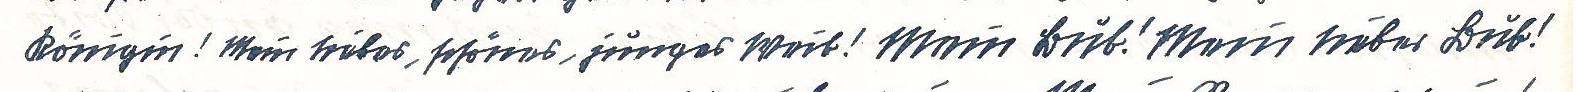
Königin! Mein liebes, schönes, junges Weib! Mein Bub! Mein lieber Bub!
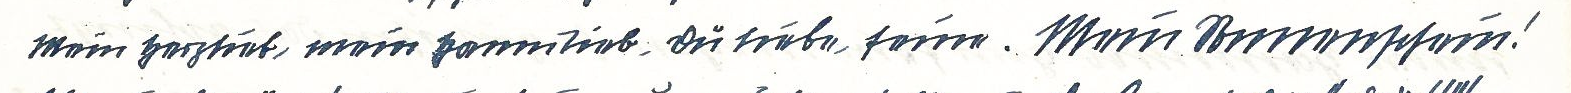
Mein Herzlieb, mein lieb, Du liebe, feine. Mein Sonnenschein!
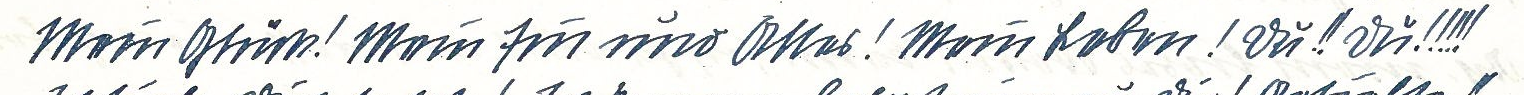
Mein Glück! Mein Ein und Alles! Mein Leben! Du!! Du!!!!!
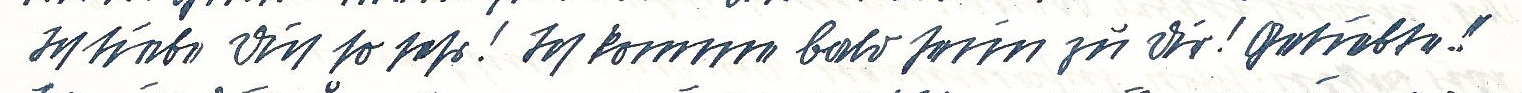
Ich liebe Dich so sehr! Ich komme bald heim zu Dir! Geliebte!!
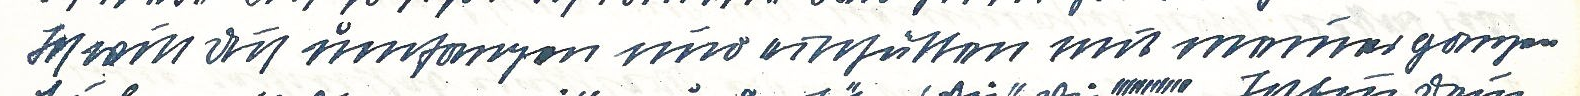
Ich will Dich umfangen und einhüllen mit meiner ganzen
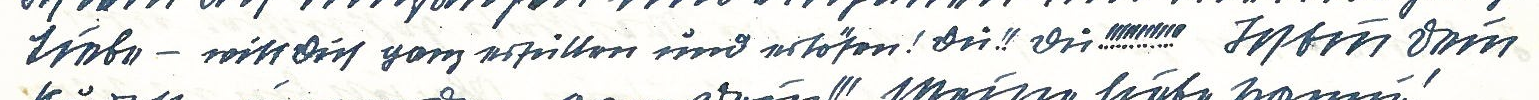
Liebe – will Dich ganz erfüllen und erlösen! Du!! Du!!!!!!!!!!!!Ich bin Dein
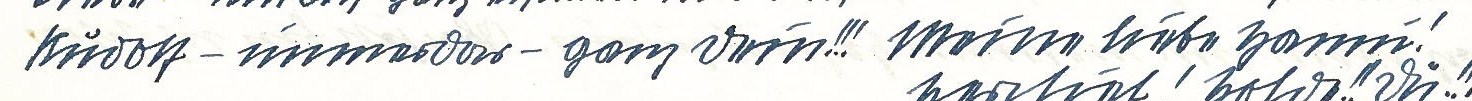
Rudolf – immerdar – ganz Dein!!! Meine liebe!
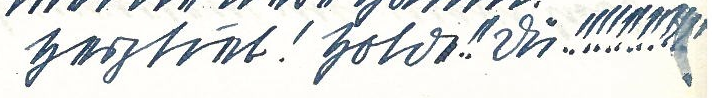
Herzlieb! Holde!! Du!!!!!!!!!!!!
